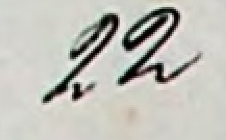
22
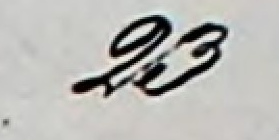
23
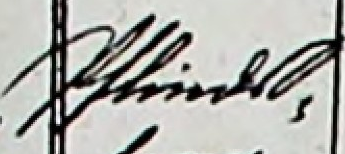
Pflinds„
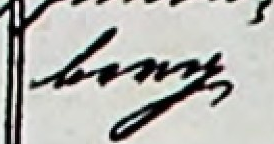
berg
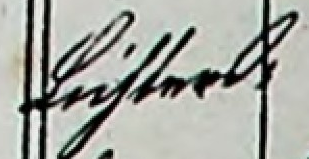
Lichterl
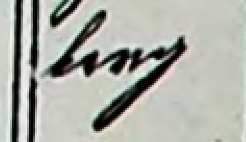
berg
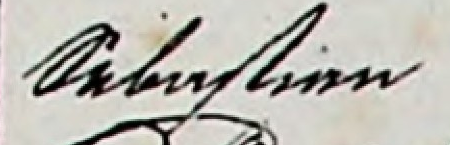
Sebastian
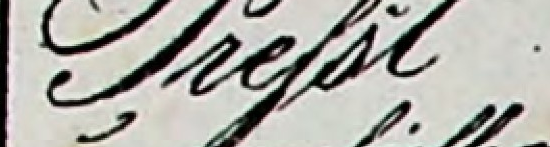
Pressl
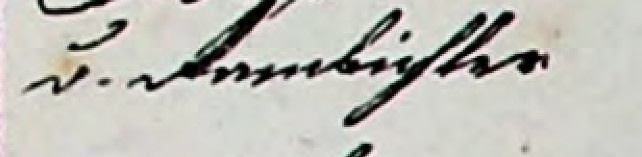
v. Dambichter
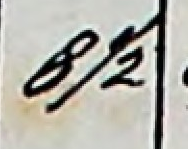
8 1/2
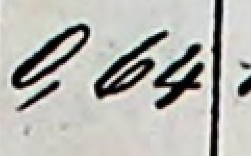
0,64
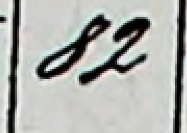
82
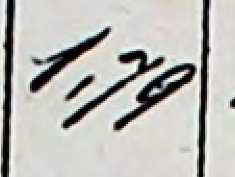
1,79
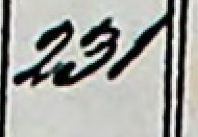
231
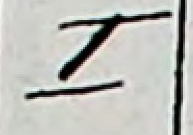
I
